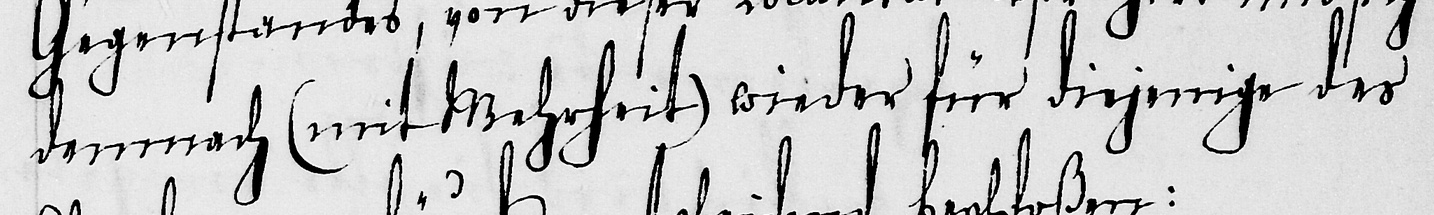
demnach (mit Mehrheit) wieder für diejenige des
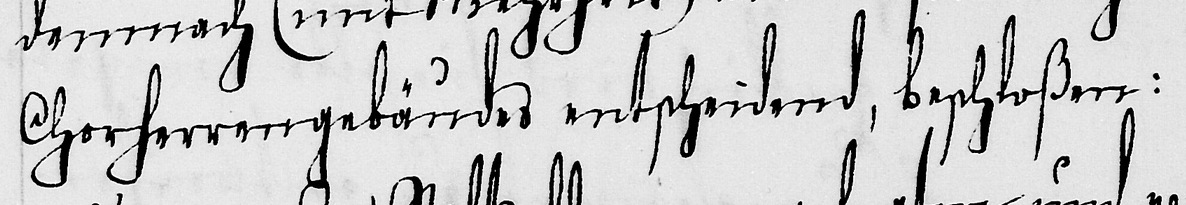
Chorherrengebäudes entscheidend, beschloßen:
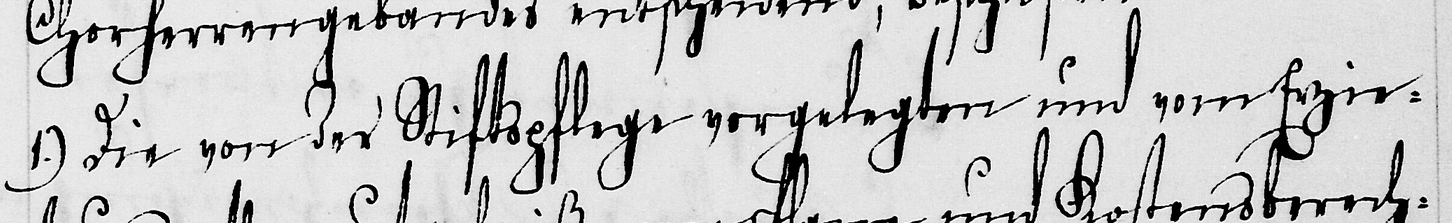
1.) Die von der Stiftspflege vorgelegten und vom Erzie¬
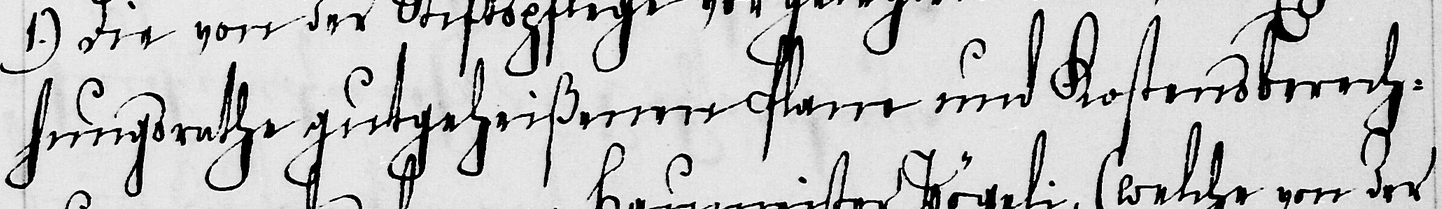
hungsrathe gutgeheißenen Plane und Kostensberech¬
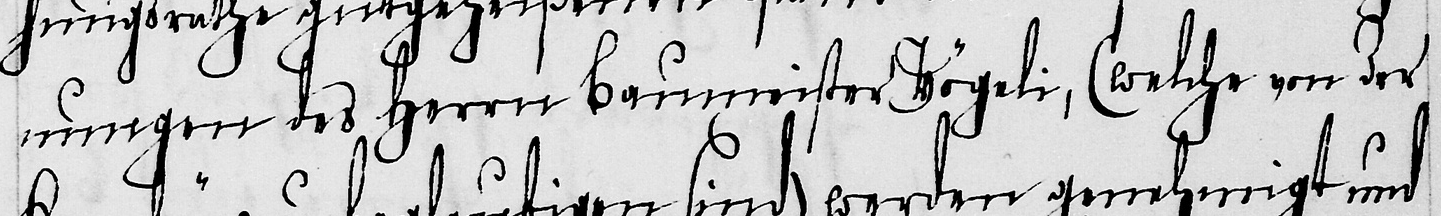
nungen des Herrn Baumeister Vögeli, (welche von der
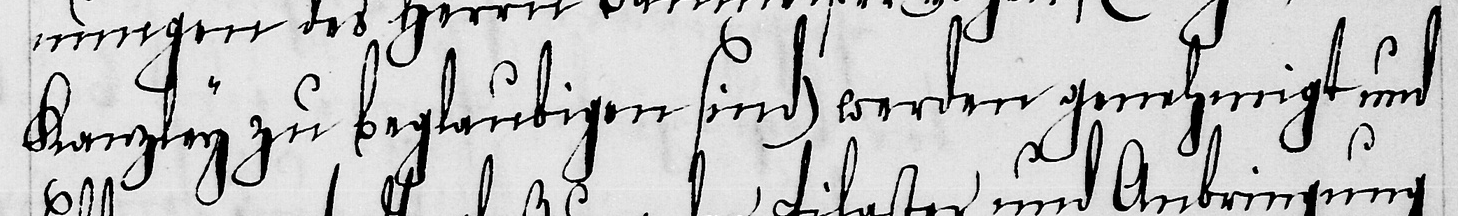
Kanzley zu beglaubigen sind) werden genehmigt und
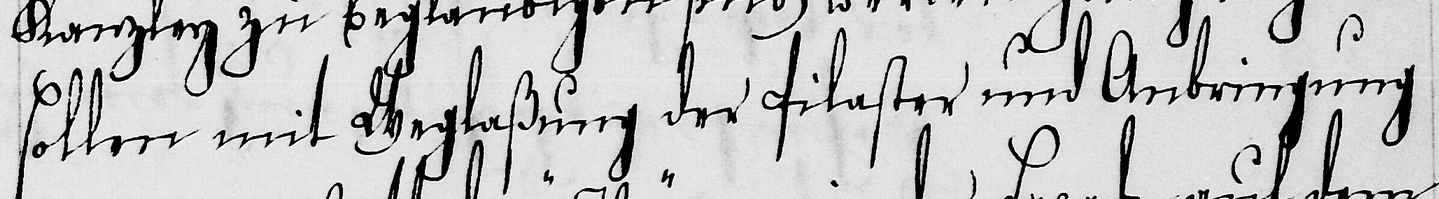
sollen mit Weglaßung der Pilaster und Anbringung
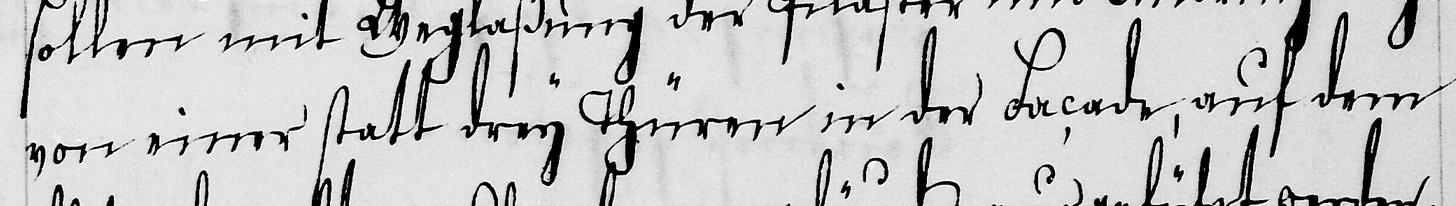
von einer statt drey Thüren in der Facade, auf dem
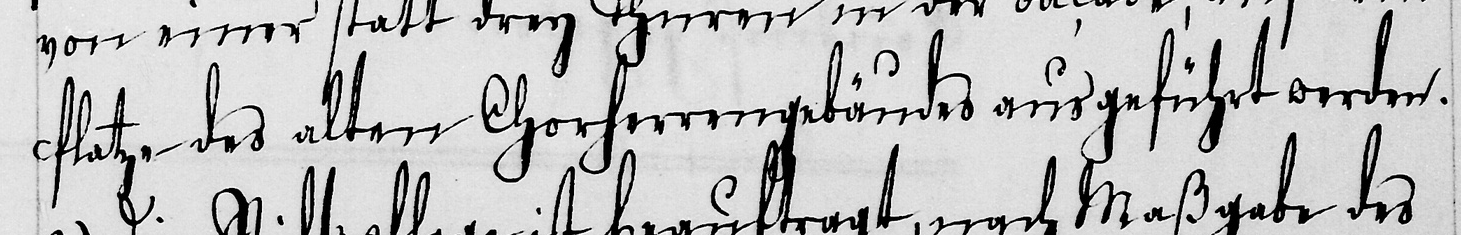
Platze des alten Chorherrengebäudes ausgeführt werden.
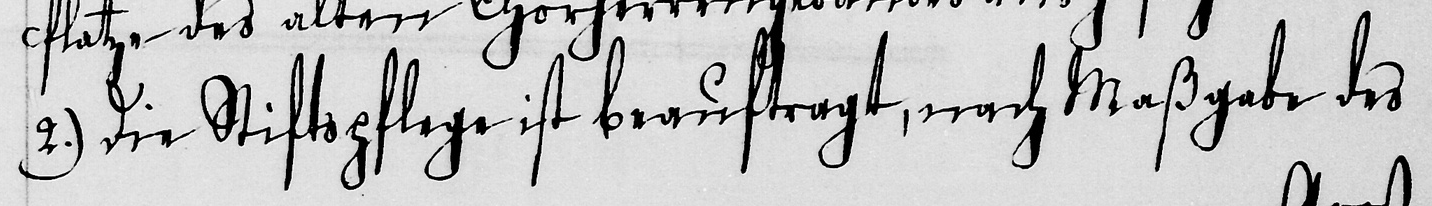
2.) Die Stiftspflege ist beauftragt, nach Maßgabe des
